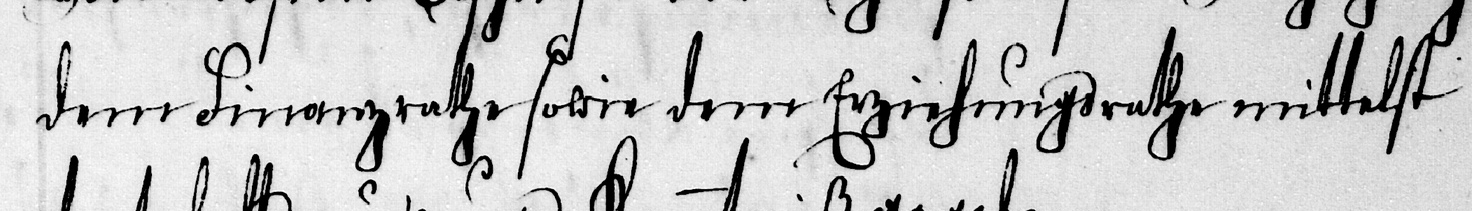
dem Finanzrathe sowie dem Erziehungsrathe mittelst
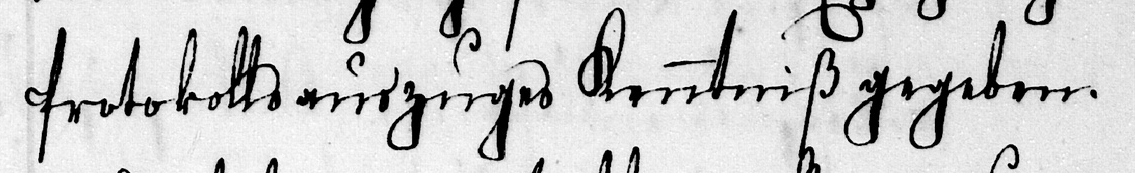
Protokollsauszuges Kenntniß gegeben.
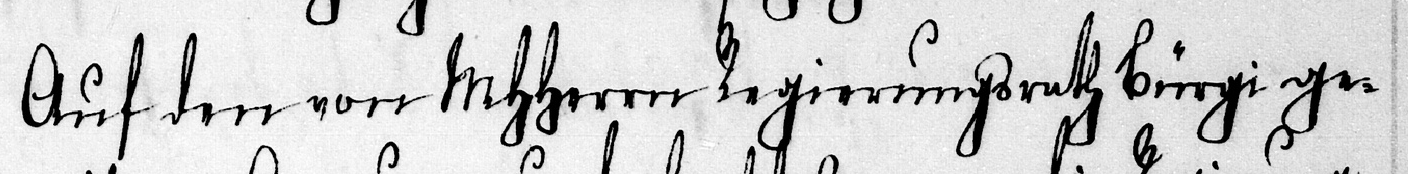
Auf den von MHHerrn Regierungsrath Bürgi ge¬
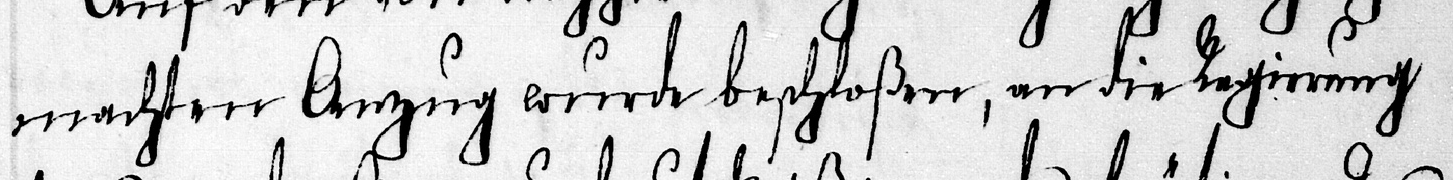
machten Anzug wurde beschloßen, an die Regierung
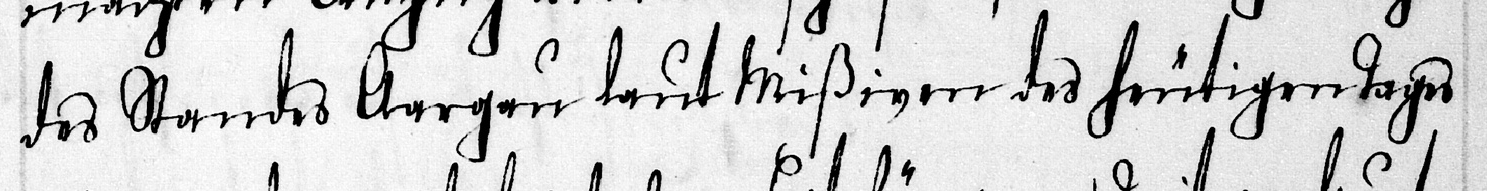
des Standes Aargau laut Mißiven des heutigen Tages
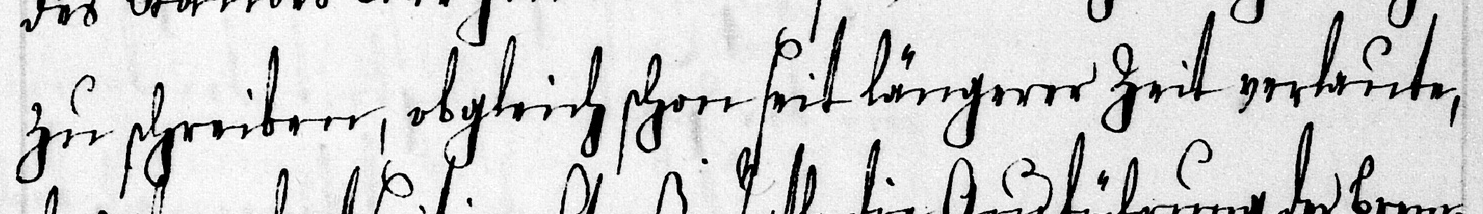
zu schreiben, obgleich schon seit längerer Zeit verlaute,
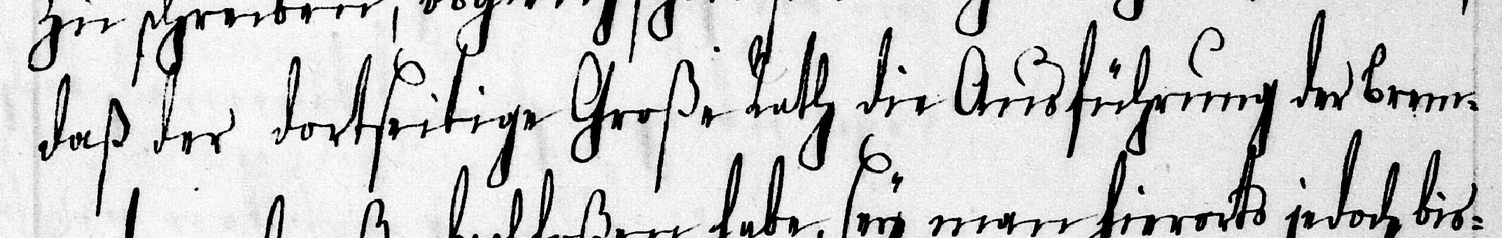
daß der dortseitige Große Rath die Ausführung der Brem¬
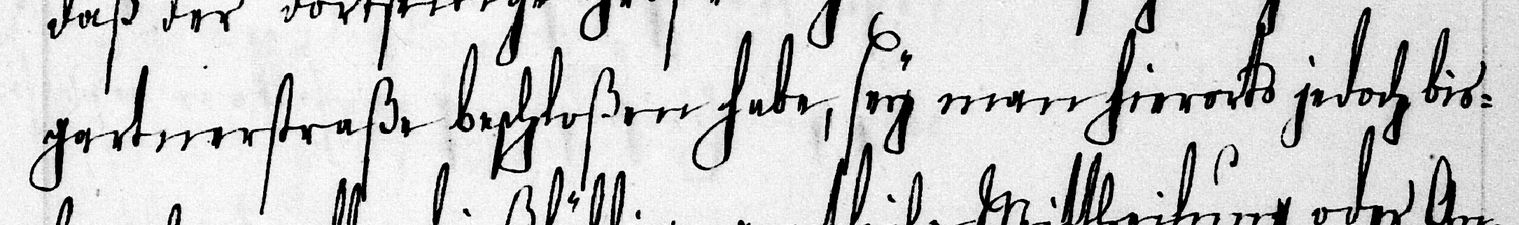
gartnerstraße beschloßen habe, sey man hierorts jedoch bis¬
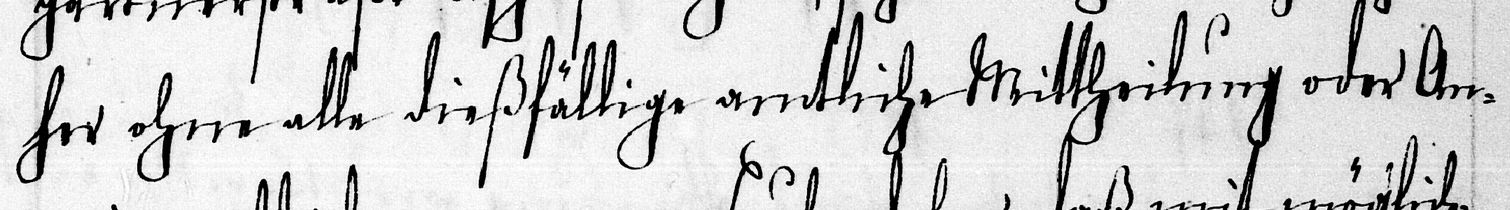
her ohne alle dießfällige amtliche Mittheilung oder An¬
